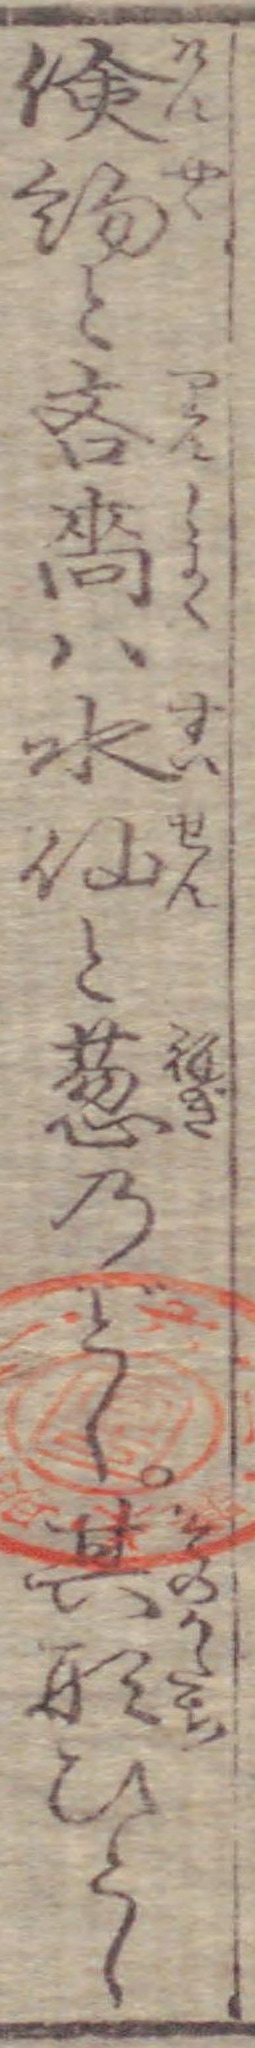倹約と吝嗇は水仙と葱のとし。其形ひとし
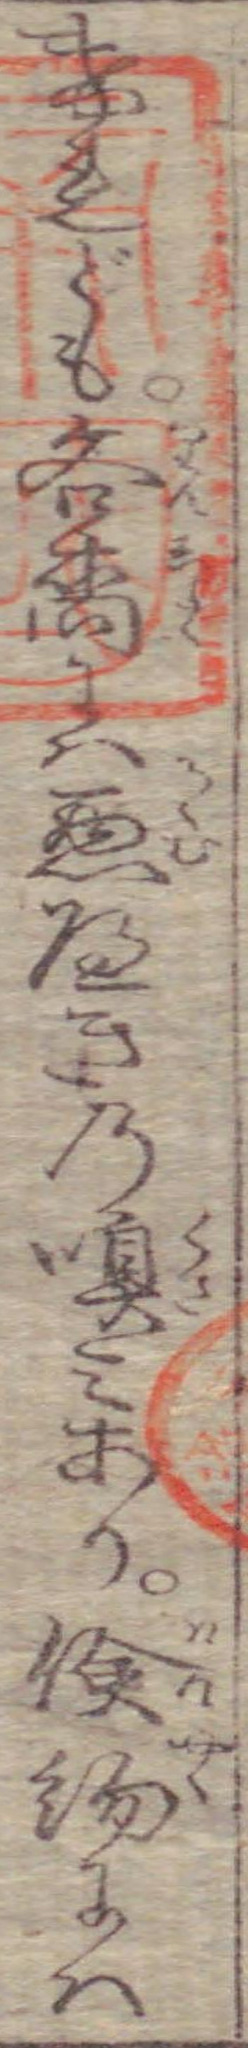けれども。吝嗇には悪べきの嗅みあり。倹約には
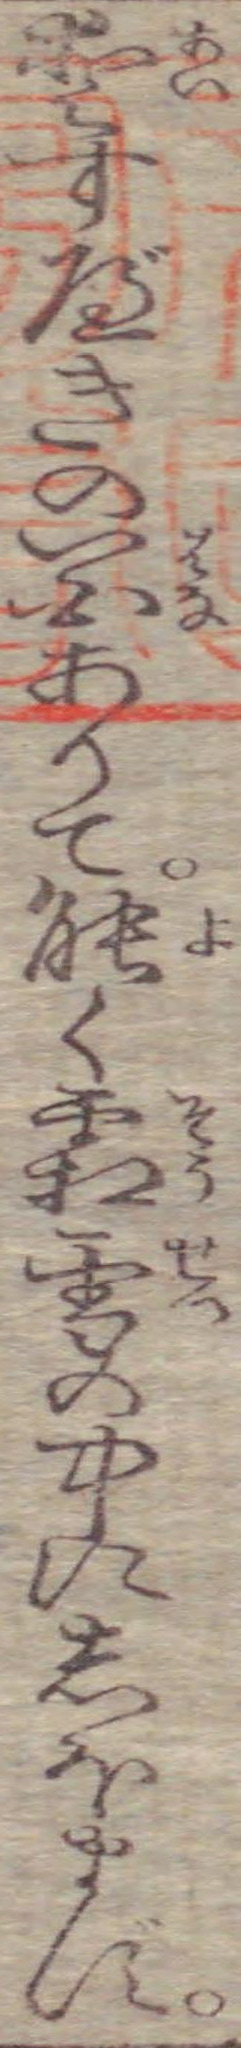愛すべきの花ありて能く霜雪の中にしほまず。
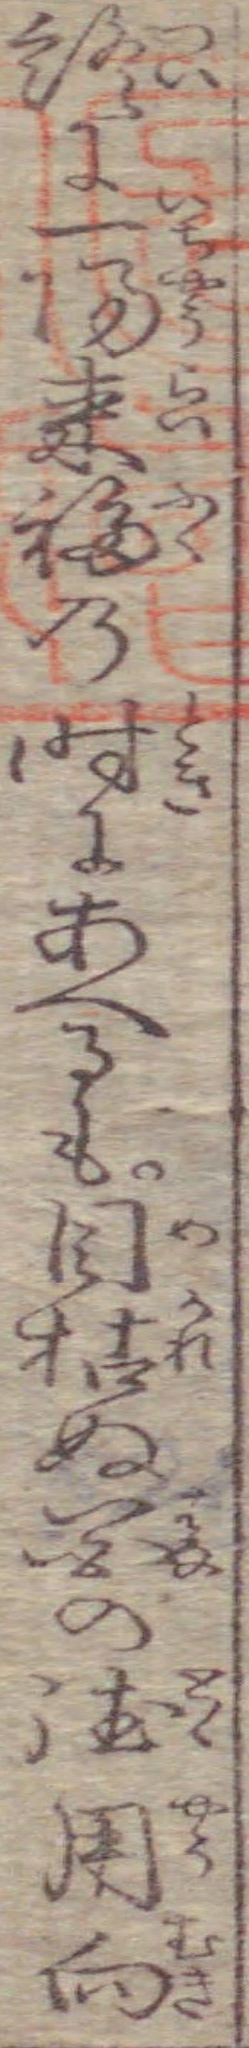終に一陽来福の時にあへるも。目枯ぬ花の徳用向
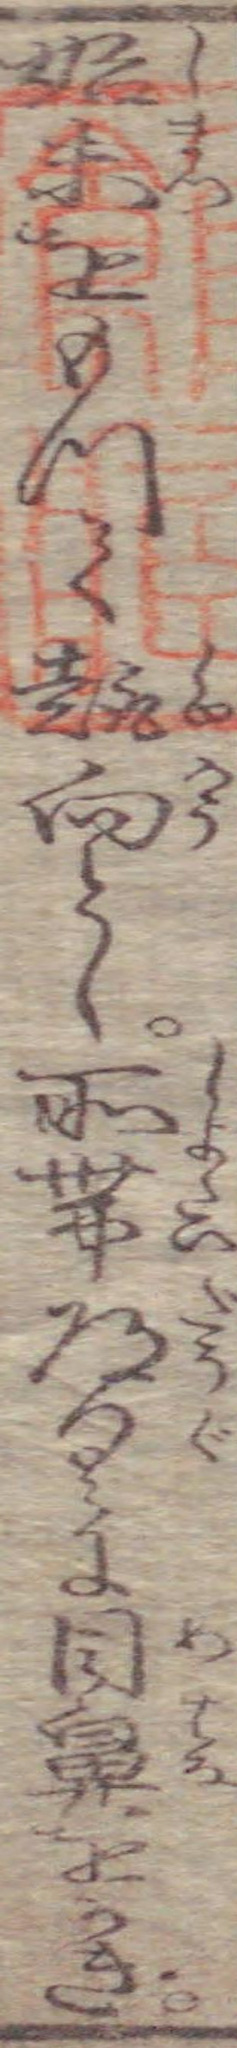始末をもつて趣向とし。所帯道具に目鼻をかき。
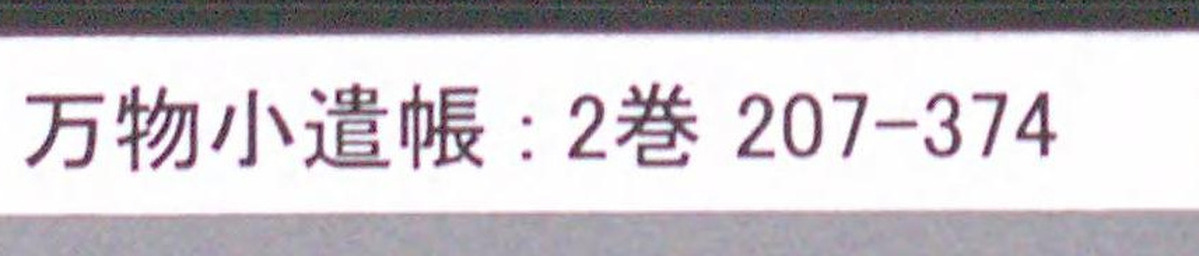万物小遺帳叙
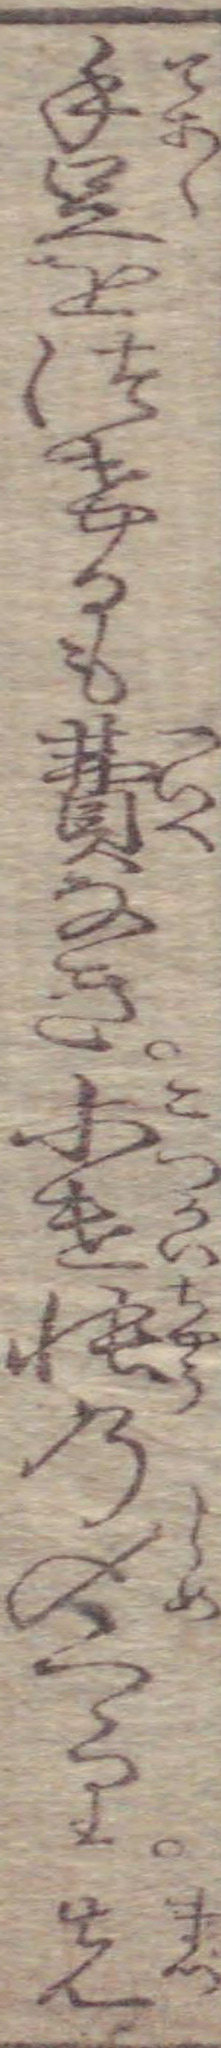手足をつけるも費なき。小遣帳の〆くゝり。先
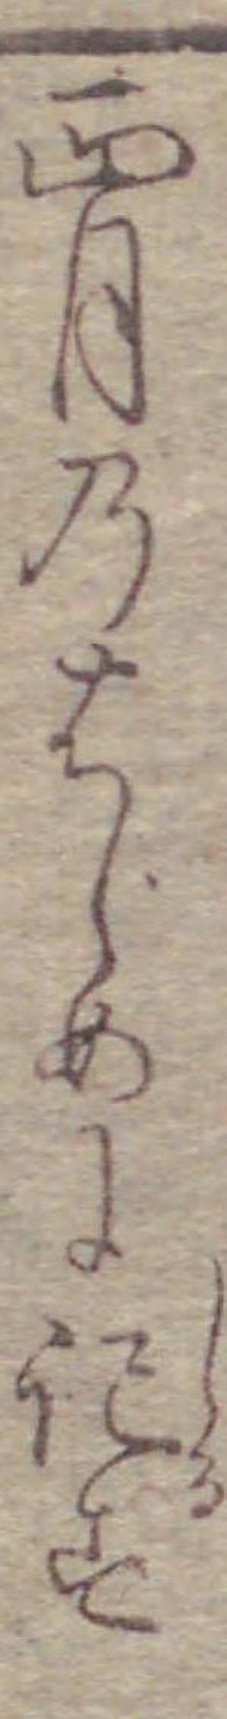正月のはじめに記す

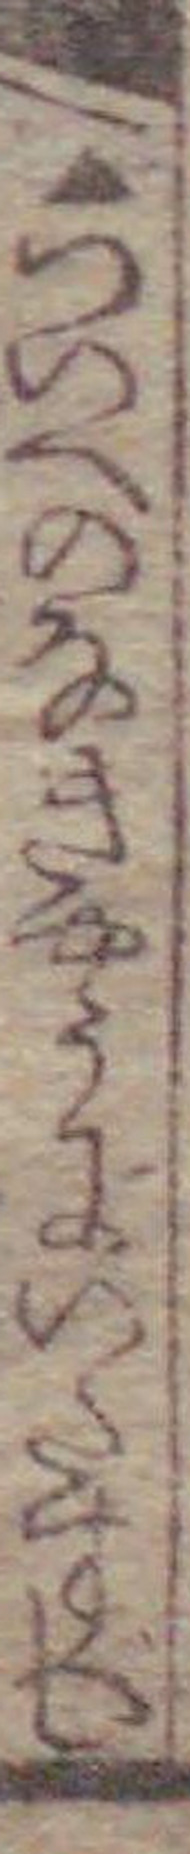▲ついへのなきやうにいたすべし
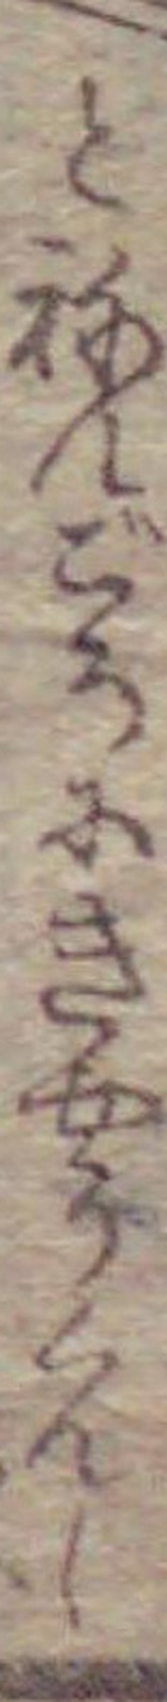とねんごろにきやうくんし
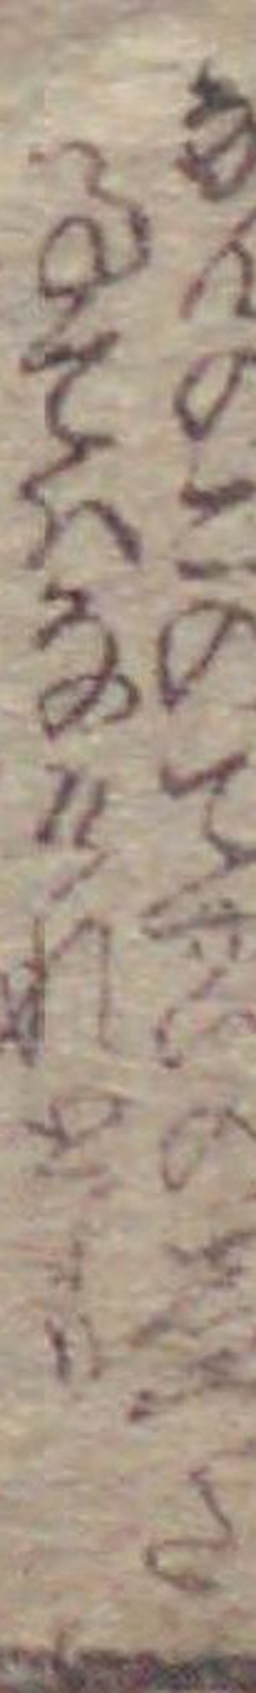事てはなけれとも
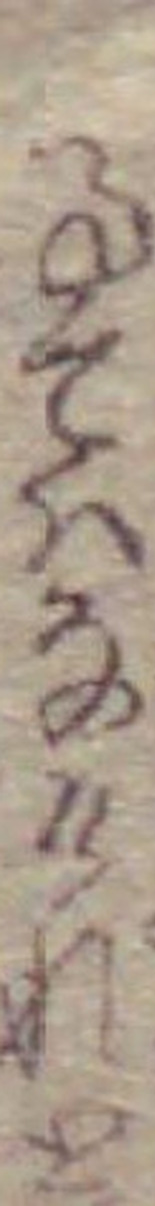事てはなけれとも
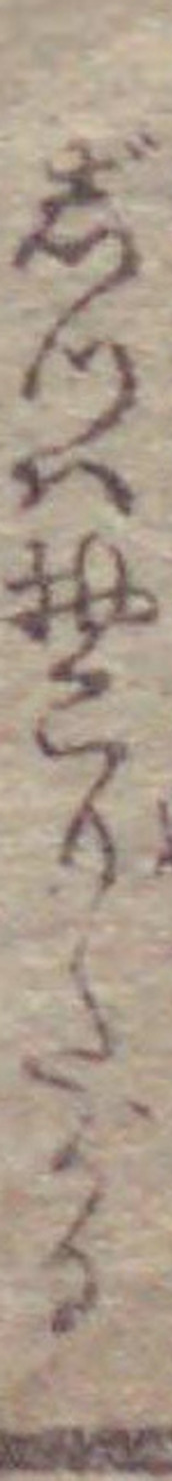じつはおこりたがる
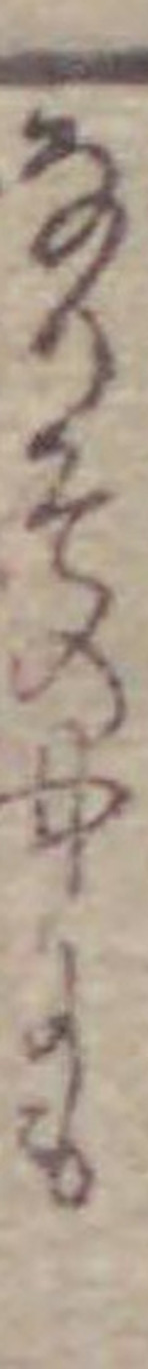なりその中にも
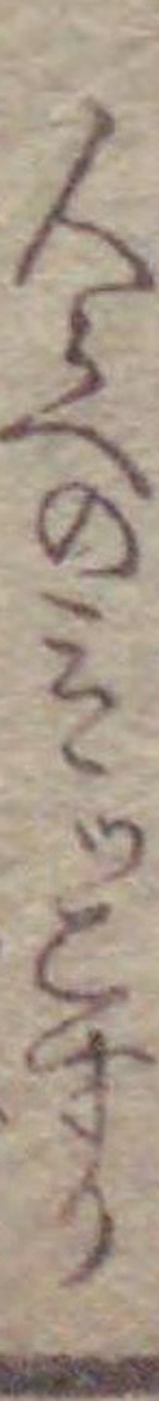人々へのみゝつこすり
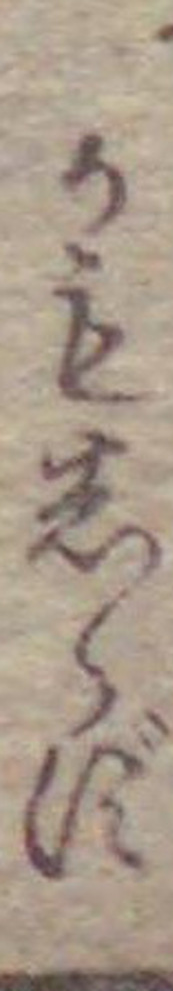かもしらず
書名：【保留】万物小遣帳 : 2巻（国会）
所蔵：国立国会図書館 National Diet Library, JAPAN
